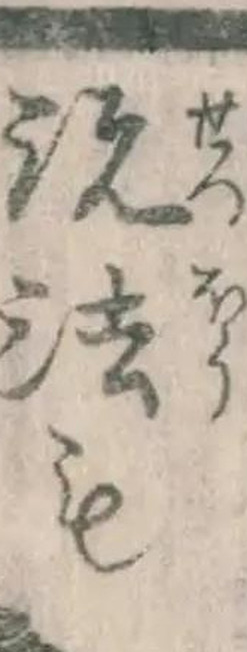説法も
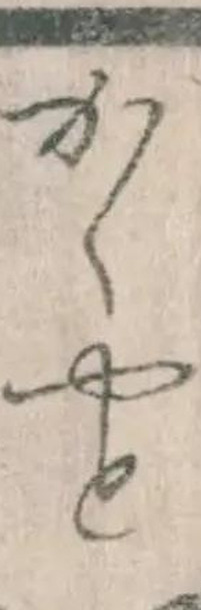かくやと
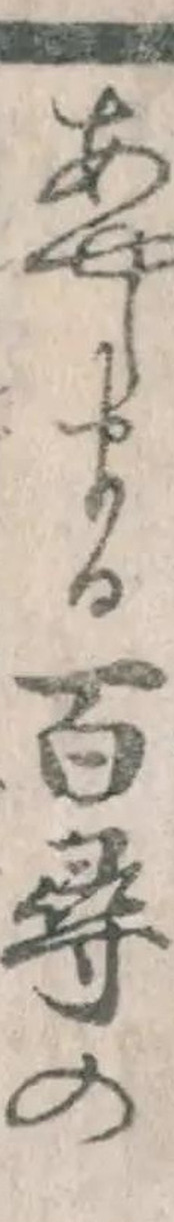あやまる百尋の
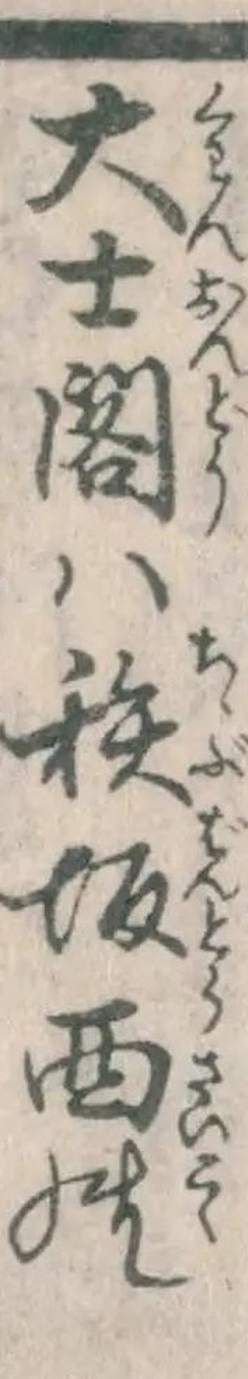大士閣は秩坂西の
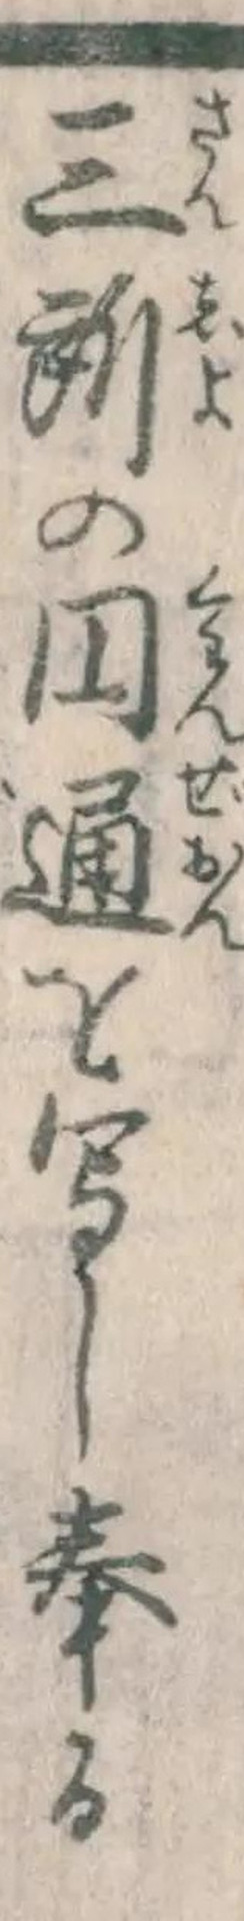三所の通を写し奉る
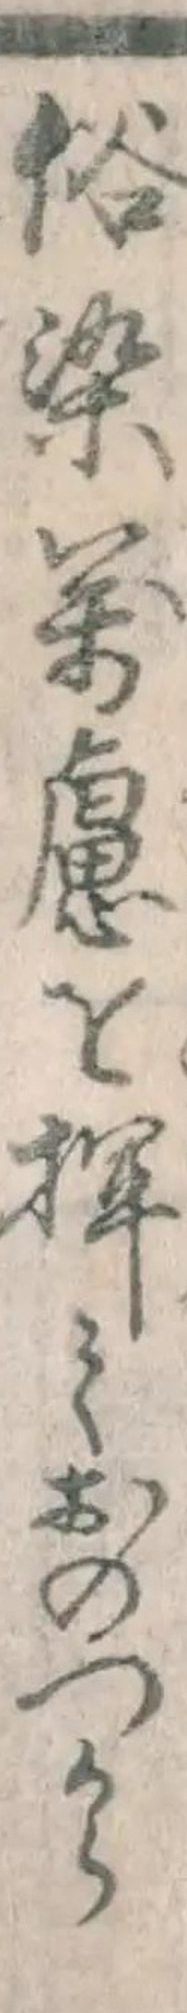俗染万慮を揮ておのつから
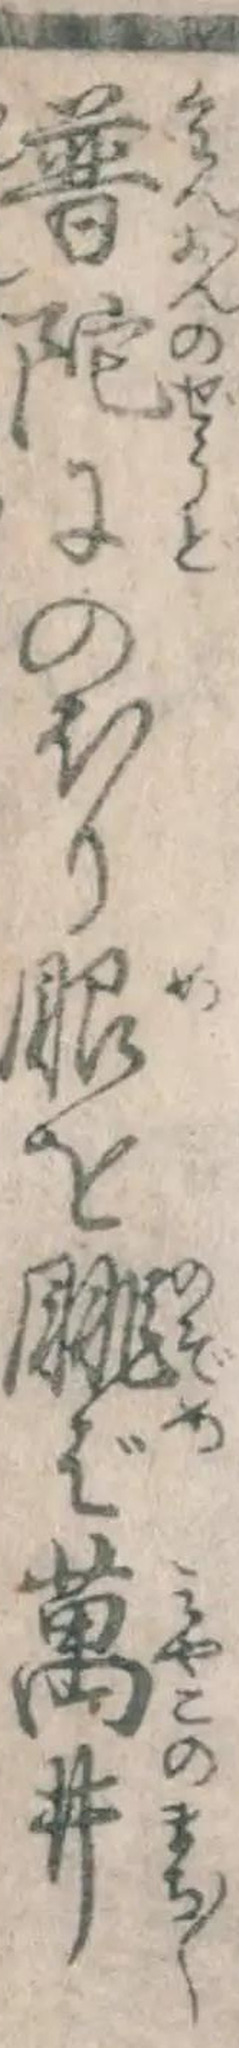普陀にのほり眼を眺ば万井
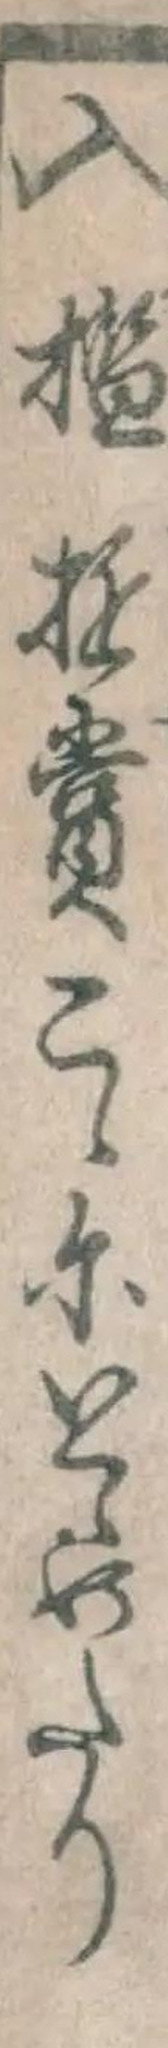入檻遊賞こゝにとゝめたり

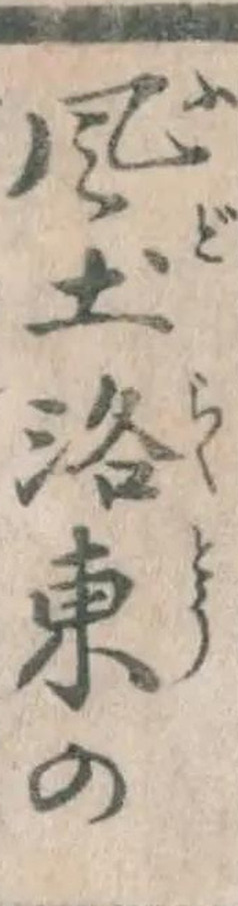風土洛東の
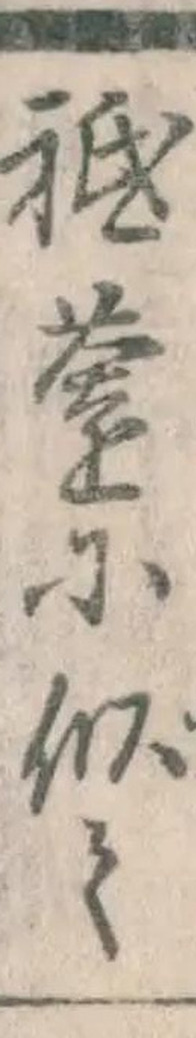祇園に似て
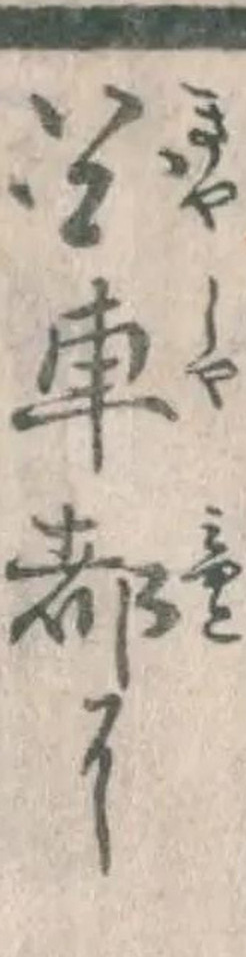花車都に
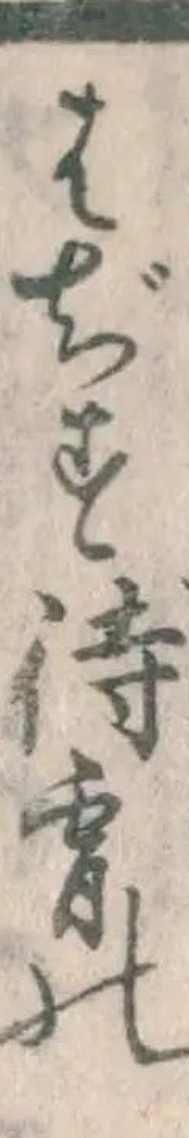はぢす待宵の
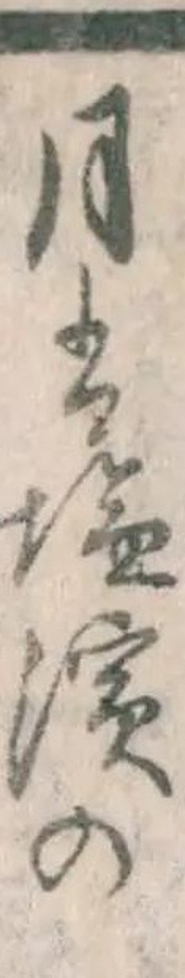月は塩浜の
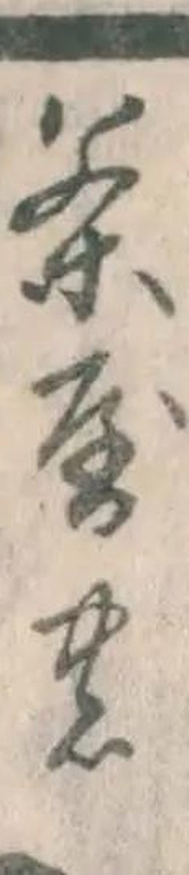茶屋の
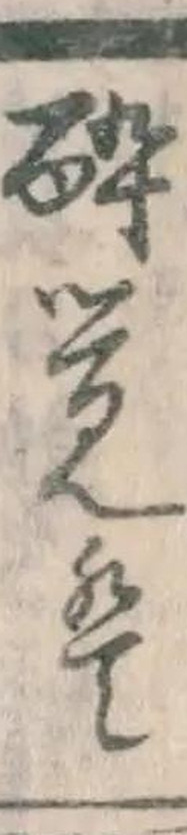酔覚は
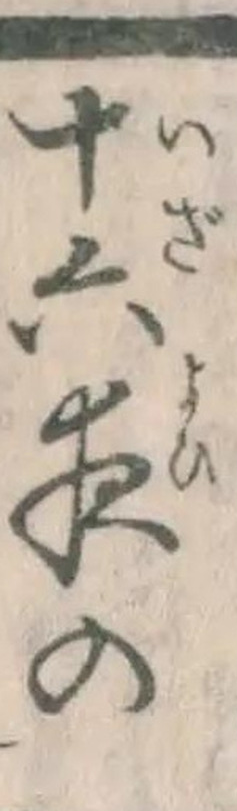十六夜の
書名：絵本物見岡
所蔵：国立国会図書館 National Diet Library, JAPAN
